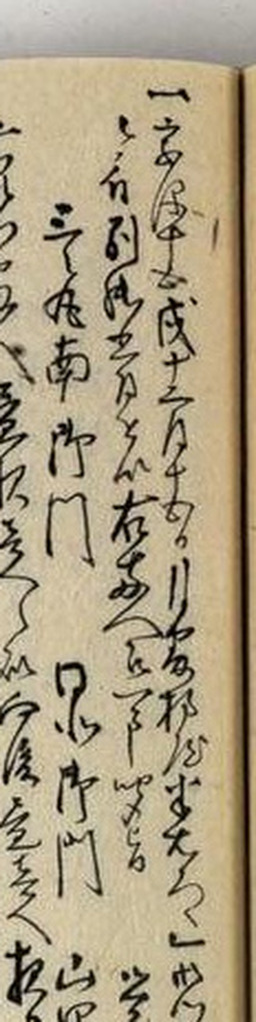候二付別紙書付を以右両人江可申聞候旨
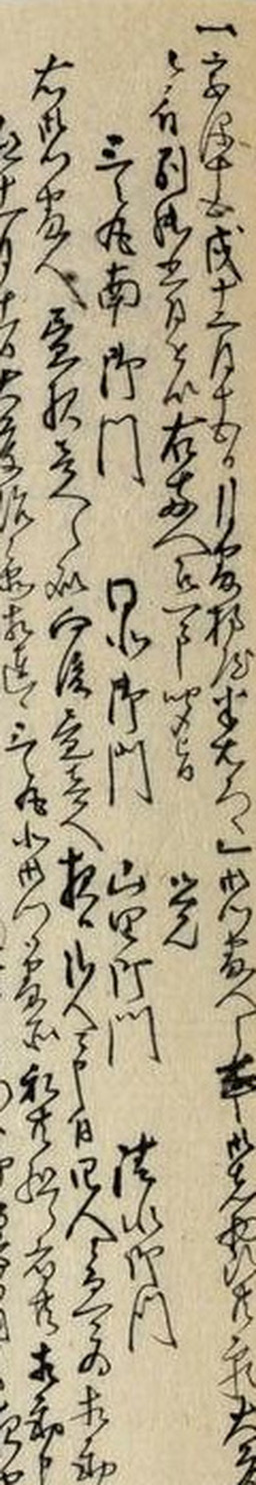三之丸南御門同北御門山里御門清水御門
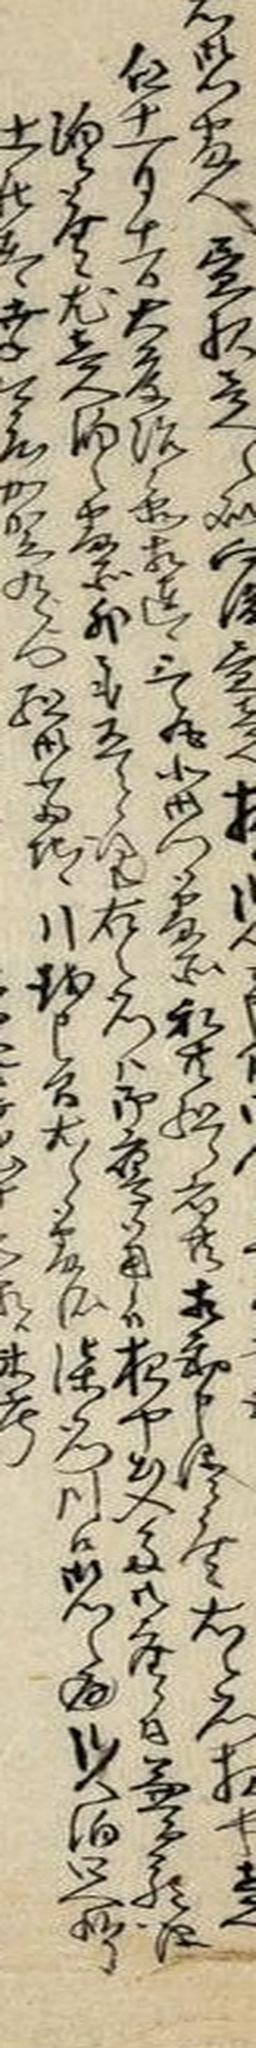仕罷在候幸今度加賀九郎右衛門組御番地へ引越候間右之番所漆御門川口御門之通弐人泊四人掛り
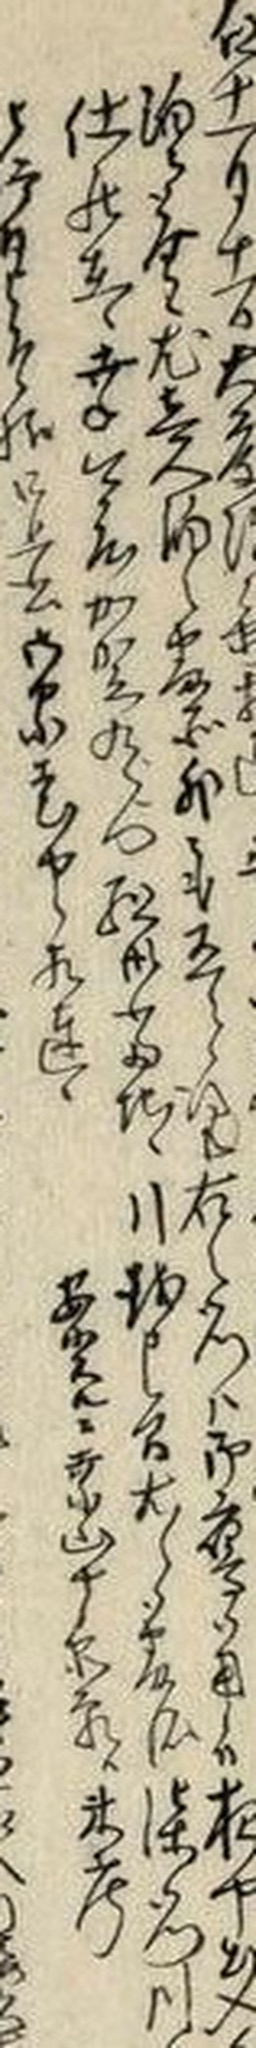被仰付被下候様口上書御家老中へ相達候案スルニ桑山十兵衛願ハ未考
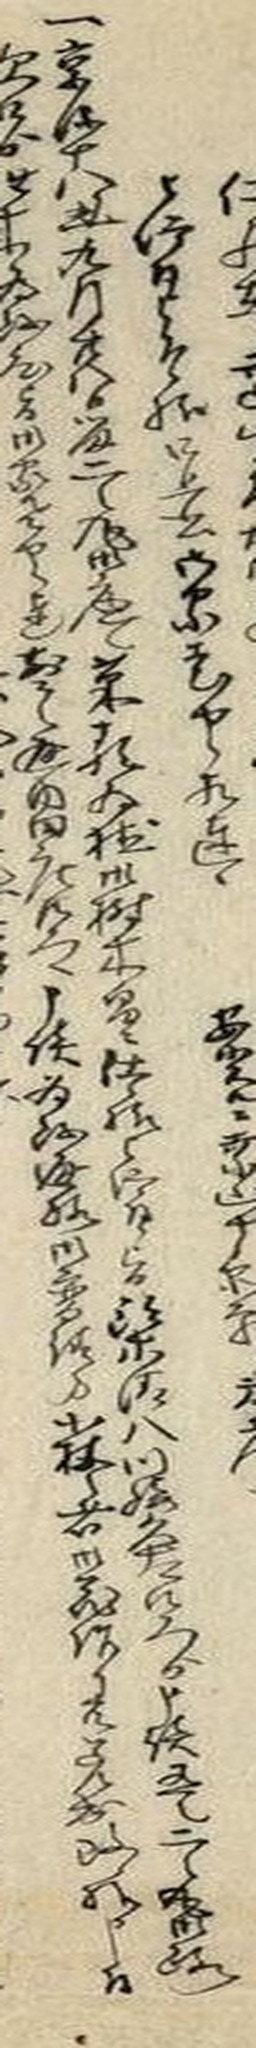次口ゟ往来為致度旨御家老中へ達前々之通内田庄左衛門へ申談為致通様御普請方小杖之者御花作り共差出致候様申付
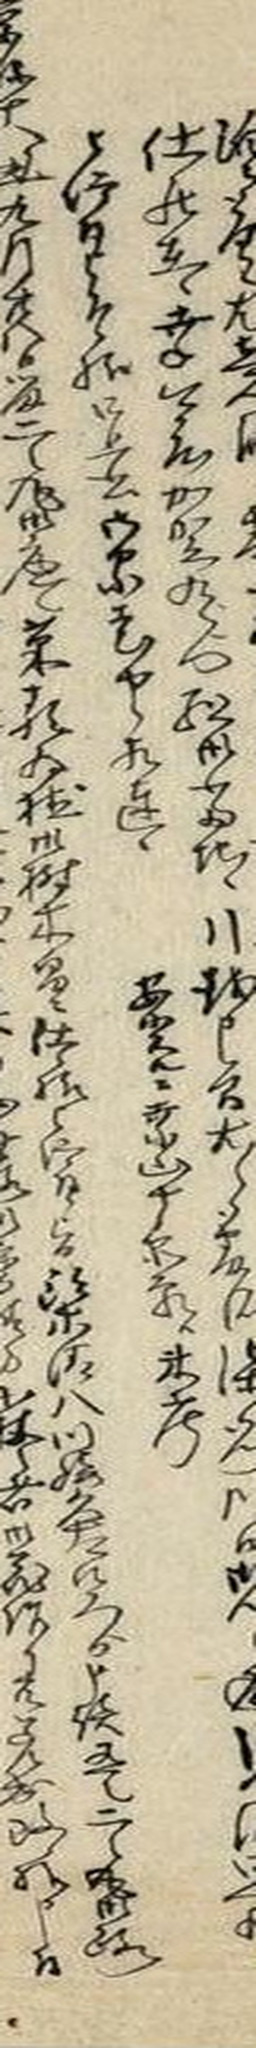一享保十八丑九月廿八日留二之丸御庭へ茶類為植御樹木畠に仕候様被仰付候旨鈴木清八川崎久太左衛門ゟ申談有之二之丸御路
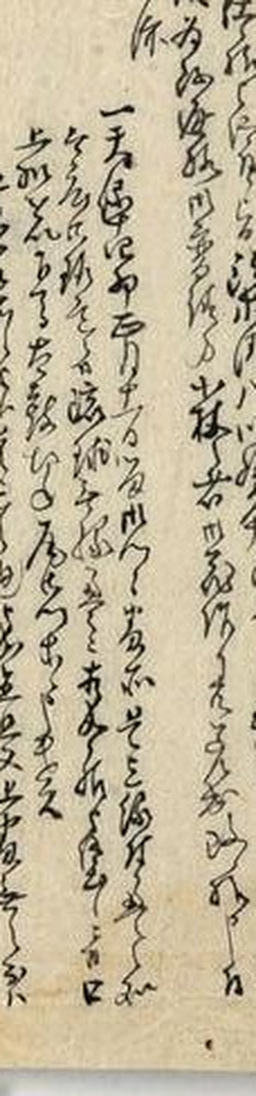一天保十四卯正月十一日留御門々番所是迄縁付畳之処
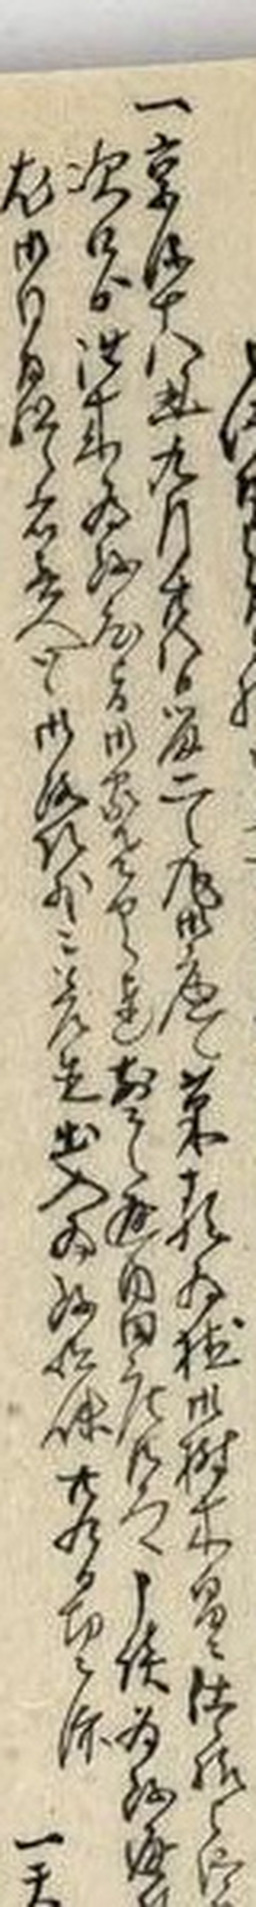尤御目付組之者壱人つゝ御役以外に差置出入為致吟味廿九日切に済
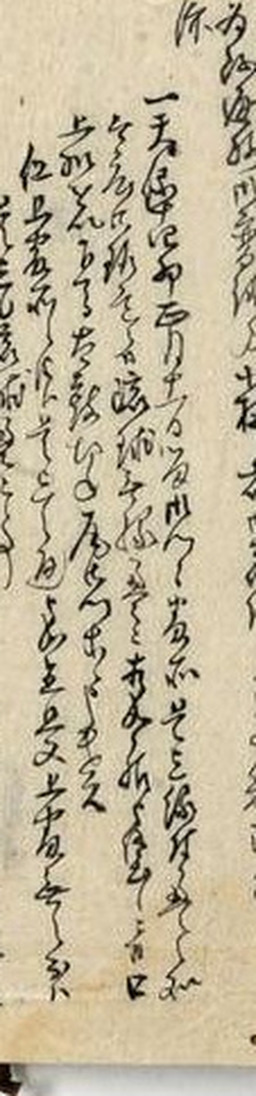今度御趣意に付琉球無縁畳に相成候様被仰出候に付口
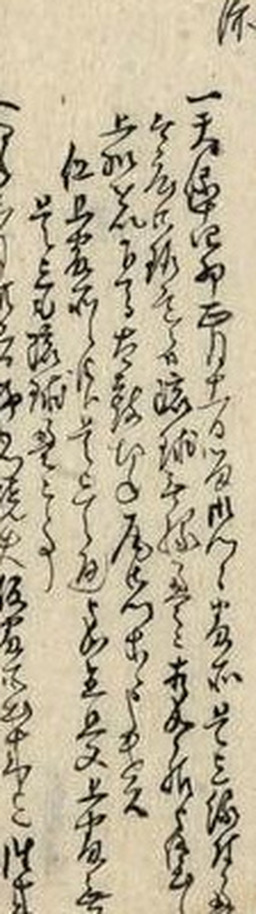上扣を以下馬太鼓切手瓦御門等へ申遣ス
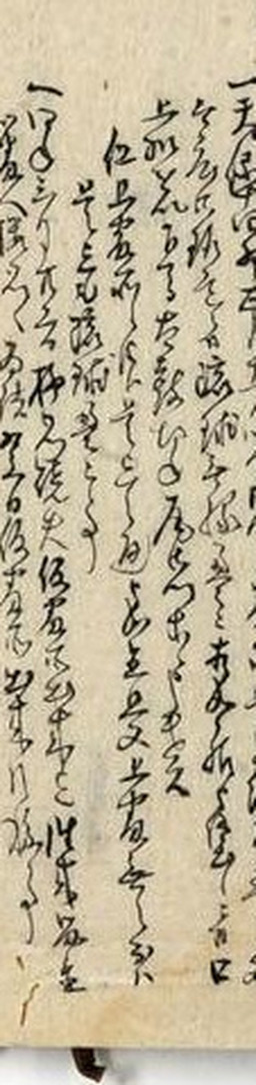但上番所之儀は是迄之通被成置且又上番無之分は
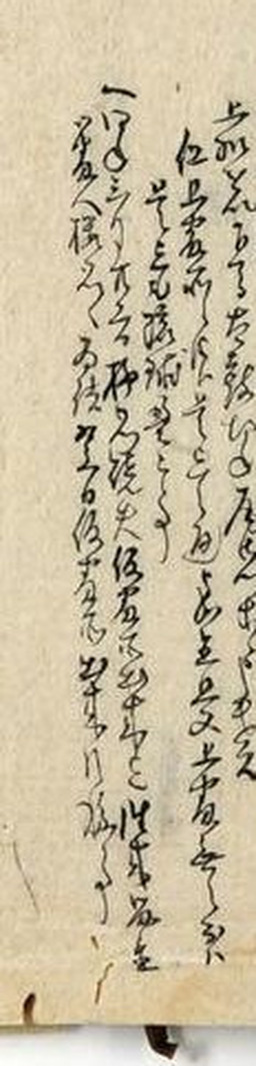一同年三月廿二日柳御門焼失仮番所出来候迄往来留置
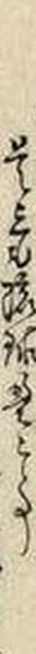是迄も琉球畳に候事
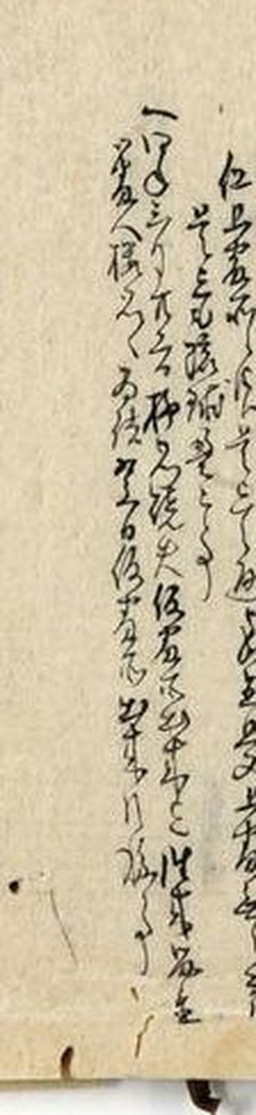御番人桜御門へ為詰翌日仮番所出来引移候事

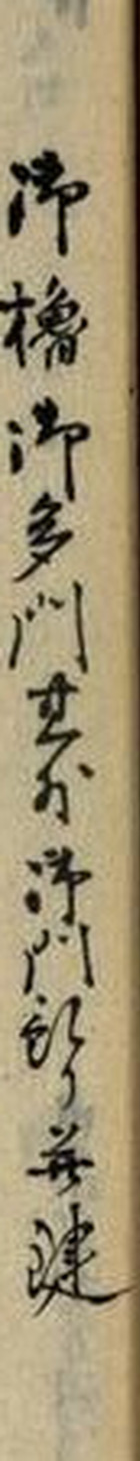御櫓御多門其外御門預り并鍵
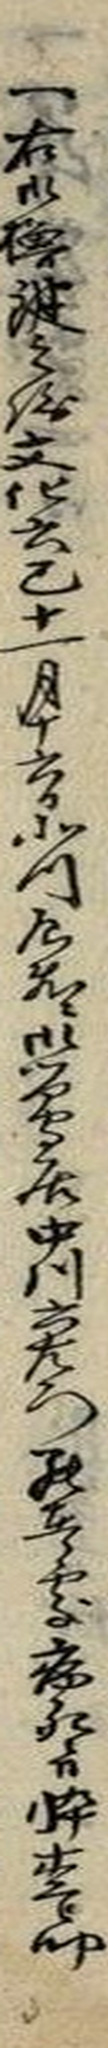一右御櫓鍵之儀文化六巳十一月十六日北川屋敷に御留守居中川六左衛門罷在候処病死に付忰帰杢之助
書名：御門御櫓之部
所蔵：福井県文書館 Fukui Prefectural Archives
